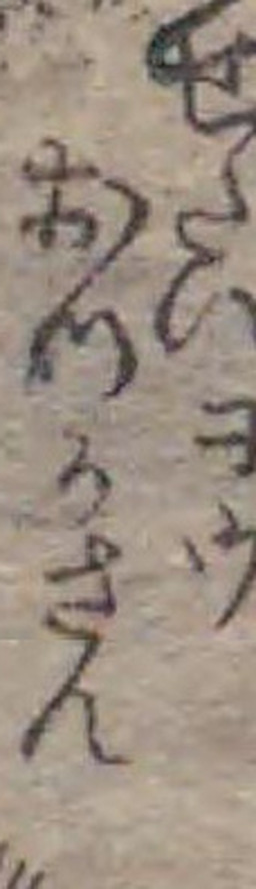おつかさん
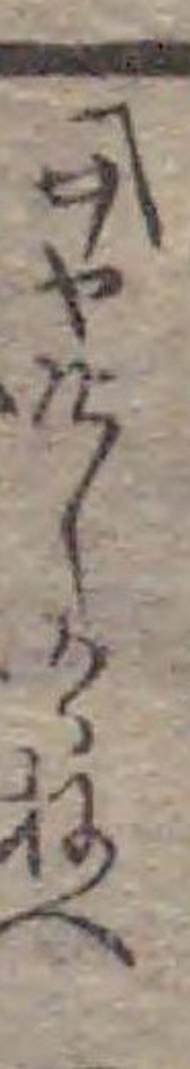〽ヲヤけしからねへ
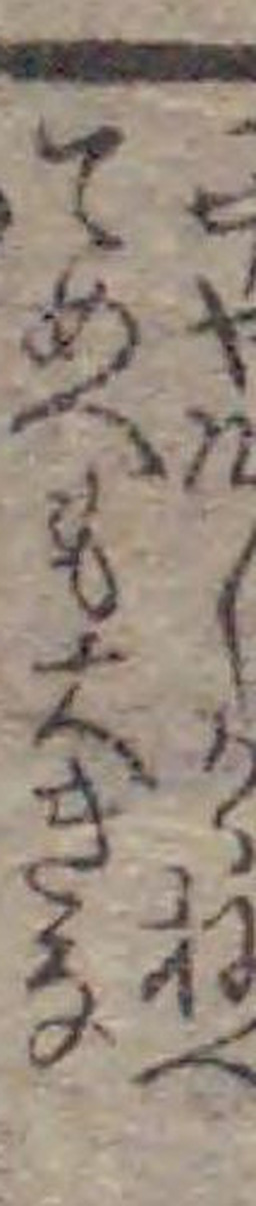てめへも大きな
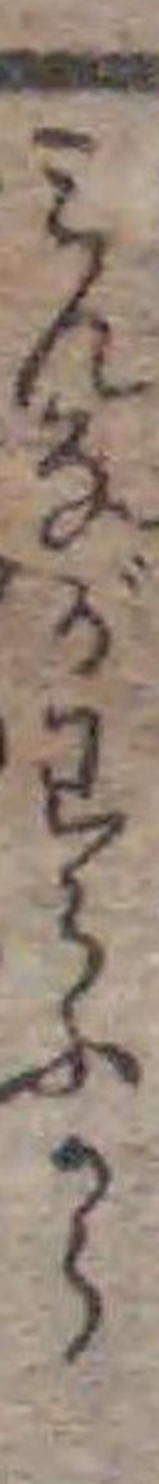みんながわらふから
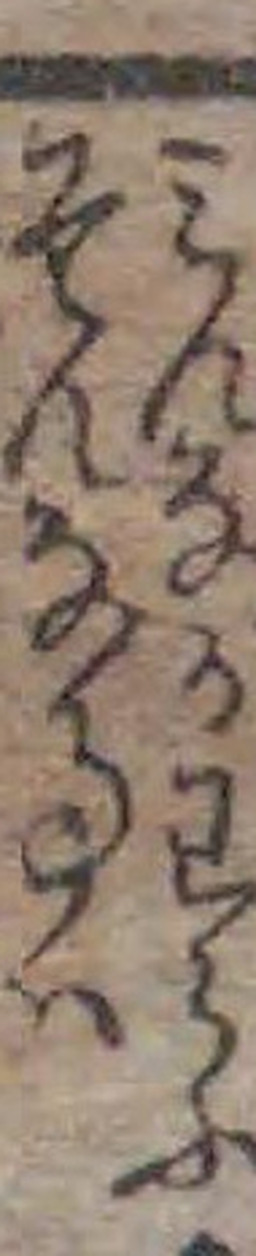そんな事い
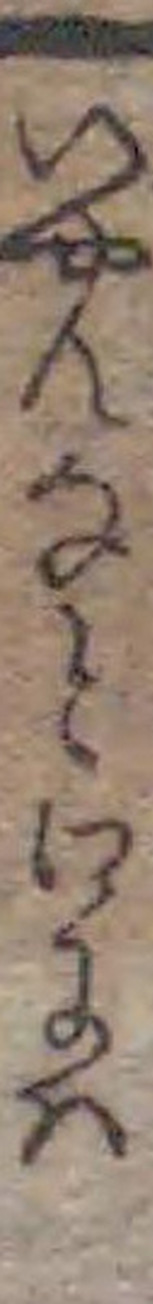いやんなと口には
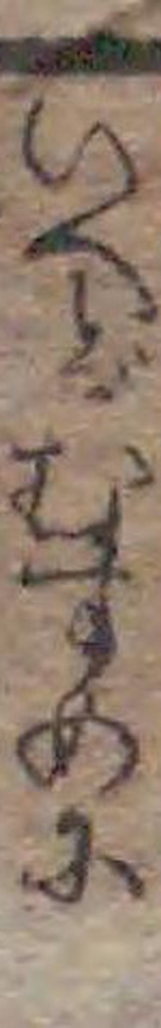いへどむすめに
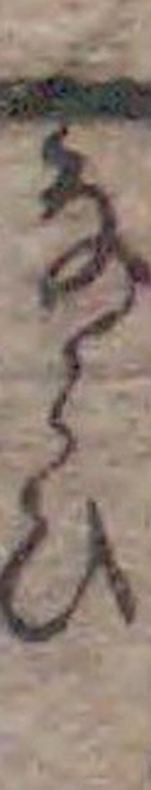ならひ
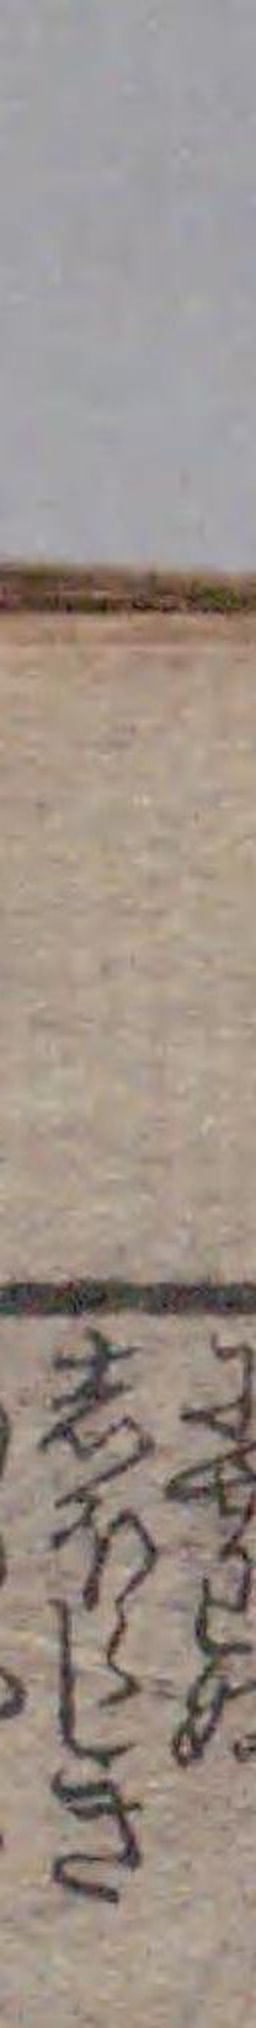しほらしき

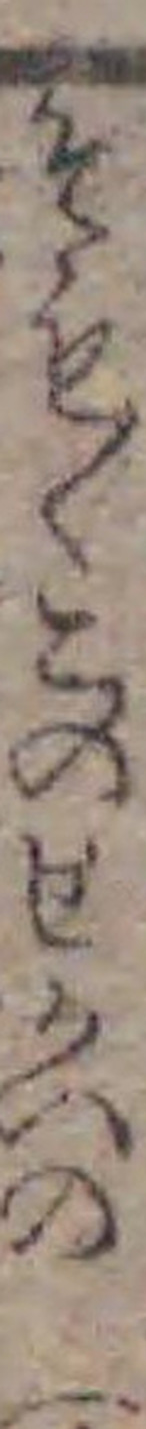そも〳〵このせかいの
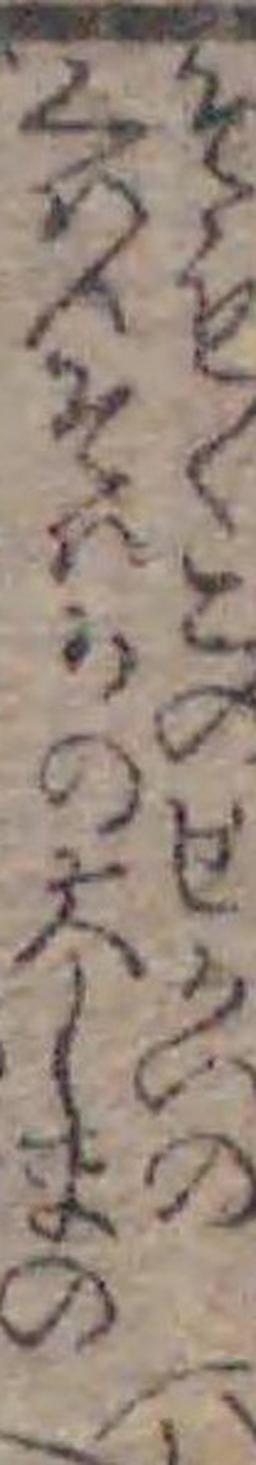くはんそはかの大しまの
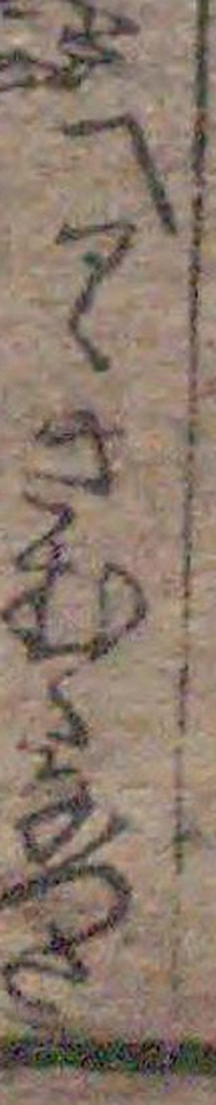〽アヽさむくなつた
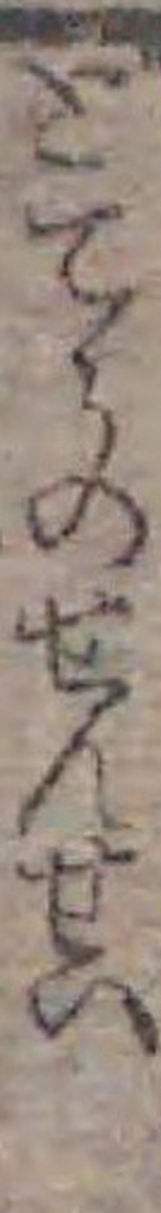どてうのせんせい
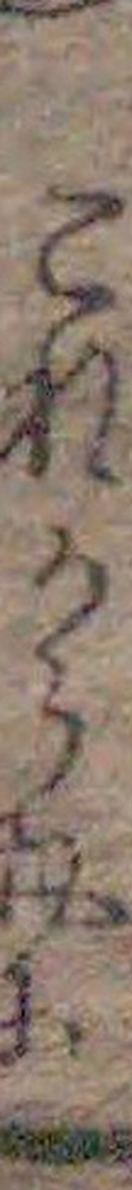これからおに
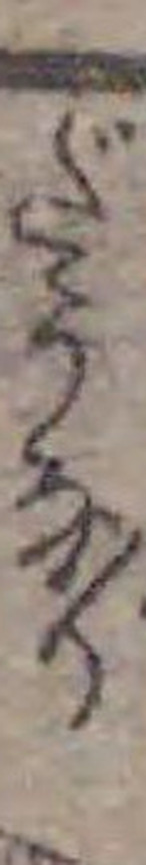だうなり
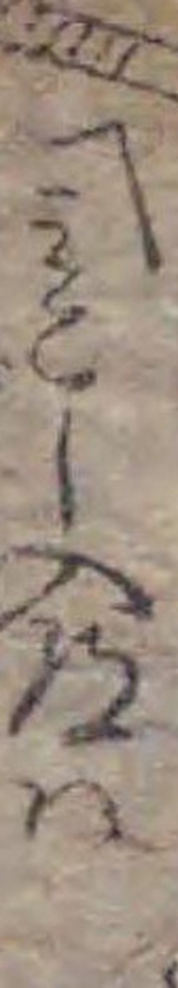〽みこし入道は
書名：年中行状記 : 2巻
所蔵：国立国会図書館 National Diet Library, JAPAN
